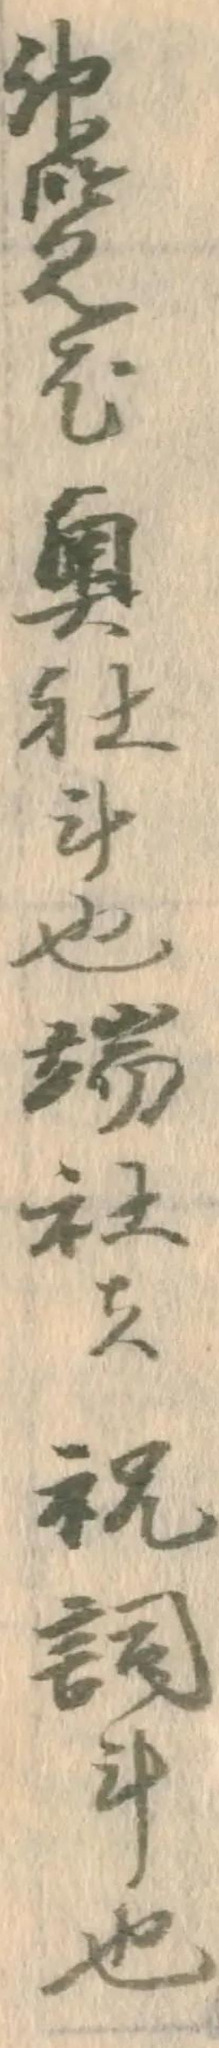神覧尤奥社計也端社は祝詞計也
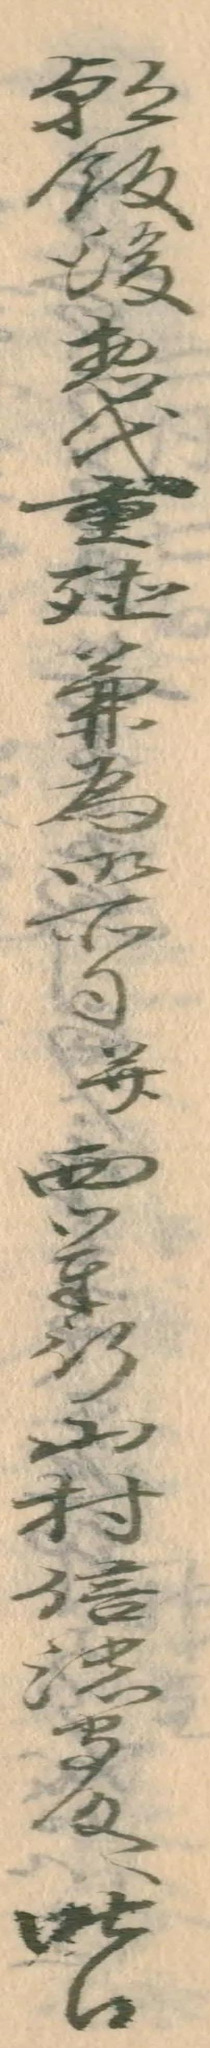一朝飯後惣代重殖兼為御所司并西御奉行山村信濃守殿へ昨日
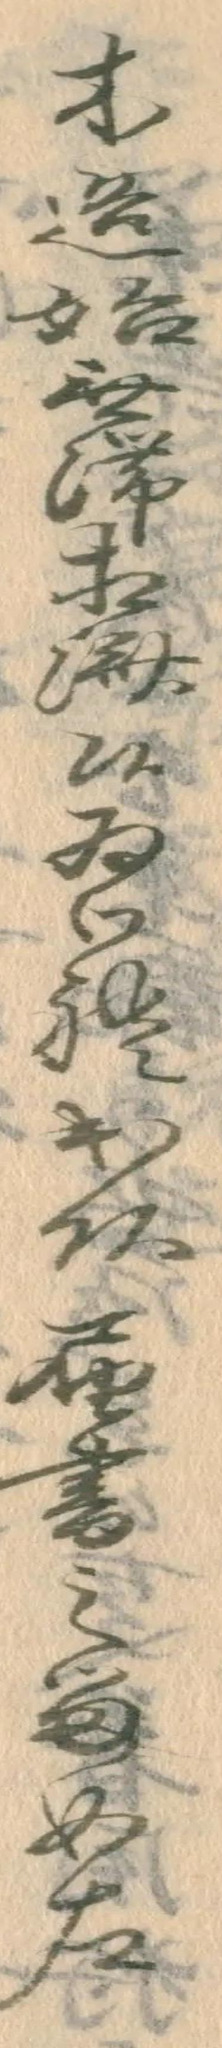木造始無滞相済候為御礼出頭届書之留如左
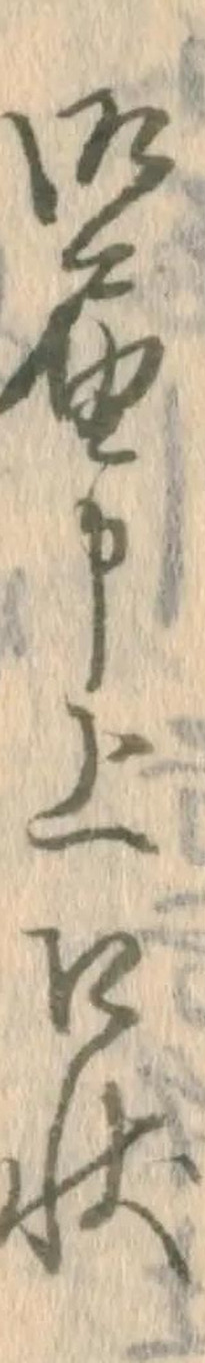御届申上口状
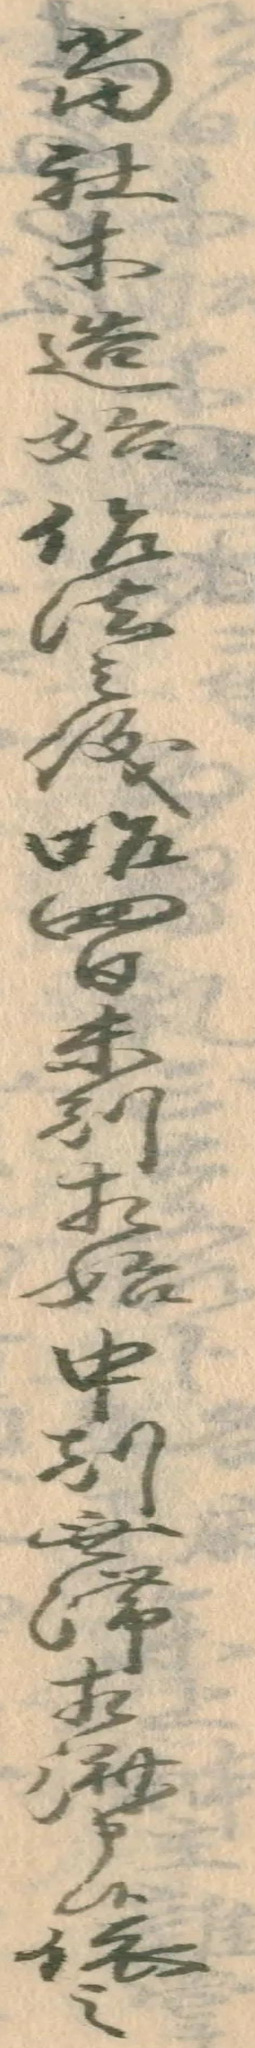当社木造始作法之儀昨四日未刻相始申刻無滞相済申候依之
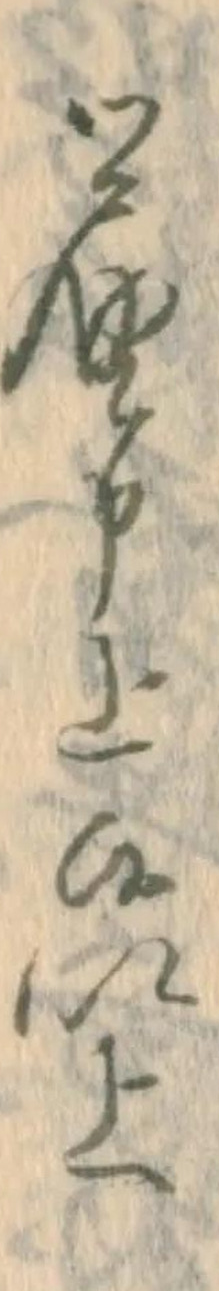御届申上候以上
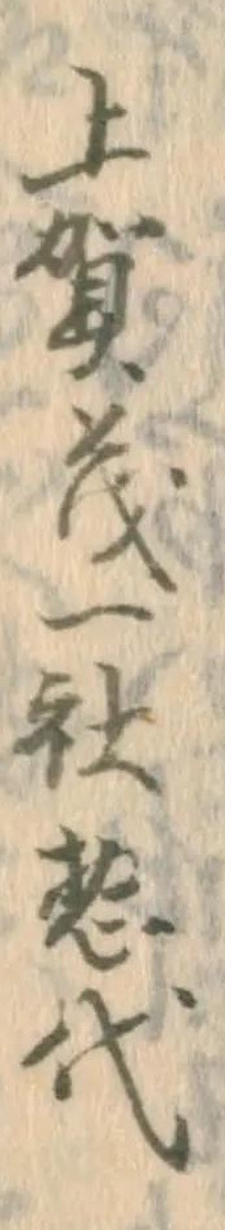上賀茂一社惣代
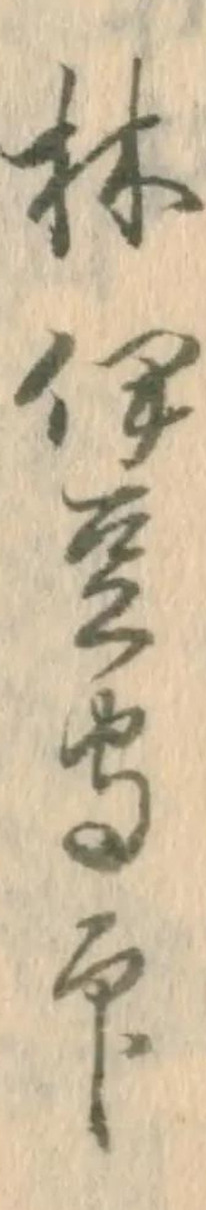林伊豆守印
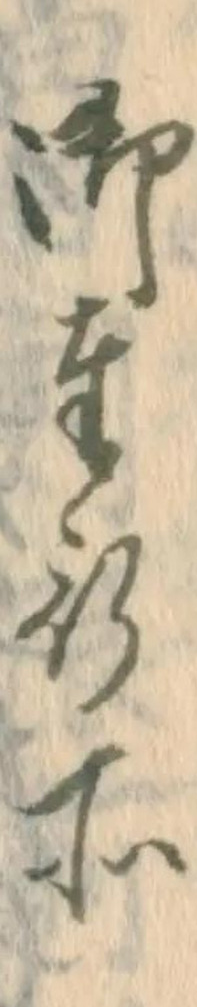御奉行所
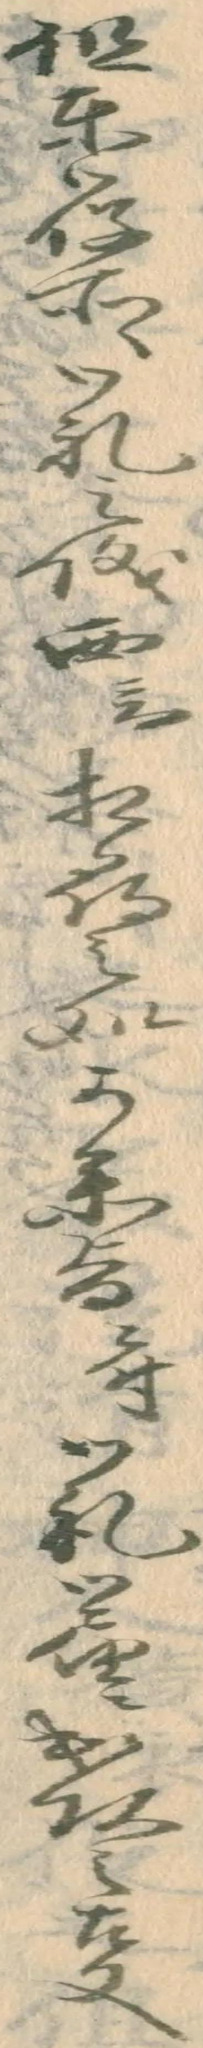但東御役所へ御礼之儀西ニ而相尋候処可参旨ニ付御礼御届ニ出仕之事
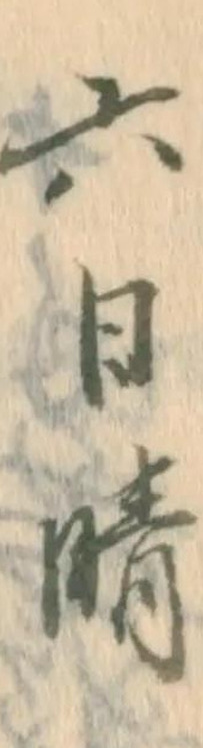六日晴
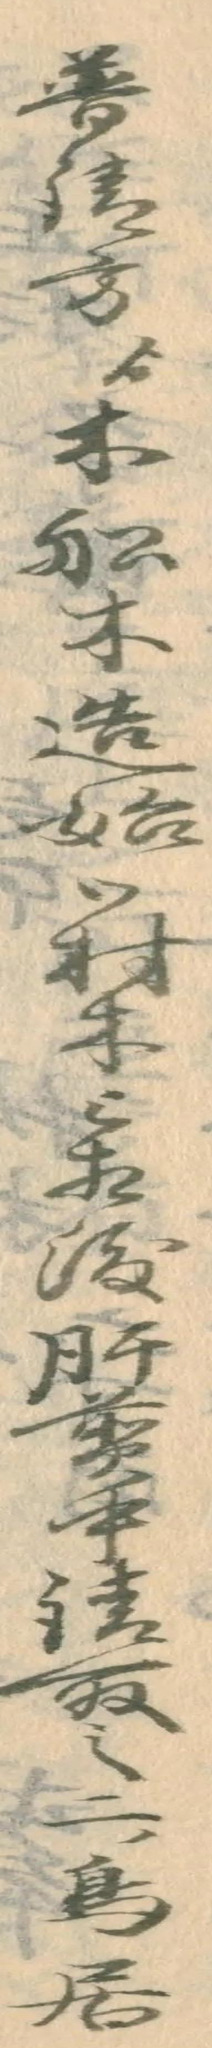一普請方ゟ木船木造始御材木被相渡肝煎中請取之二ノ鳥居
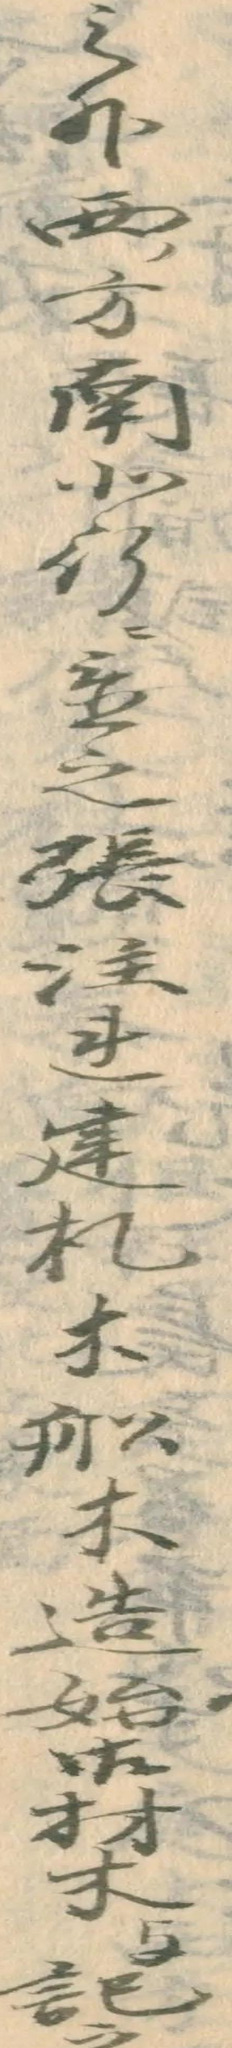之外西ノ方南北行ニ置之張注連建札木船木造始御材木与記之

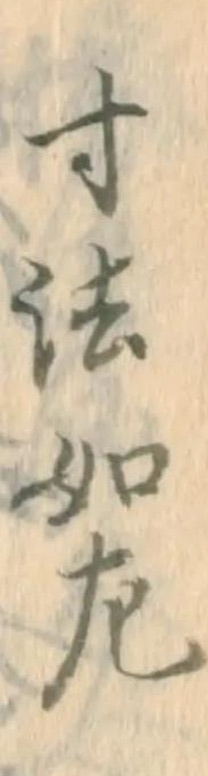寸法如左
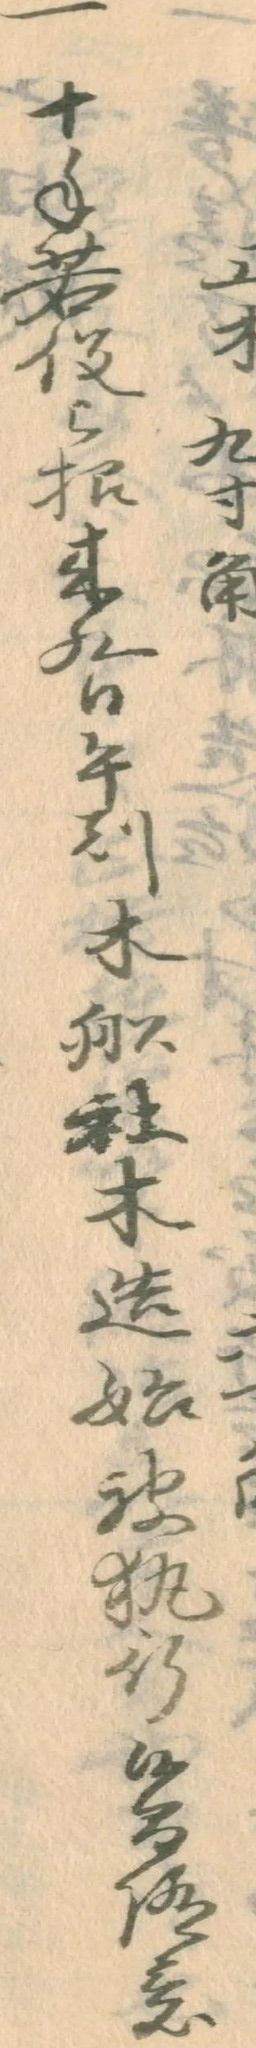一十手若役被招来九日午刻木船社木造始被執行候間随意
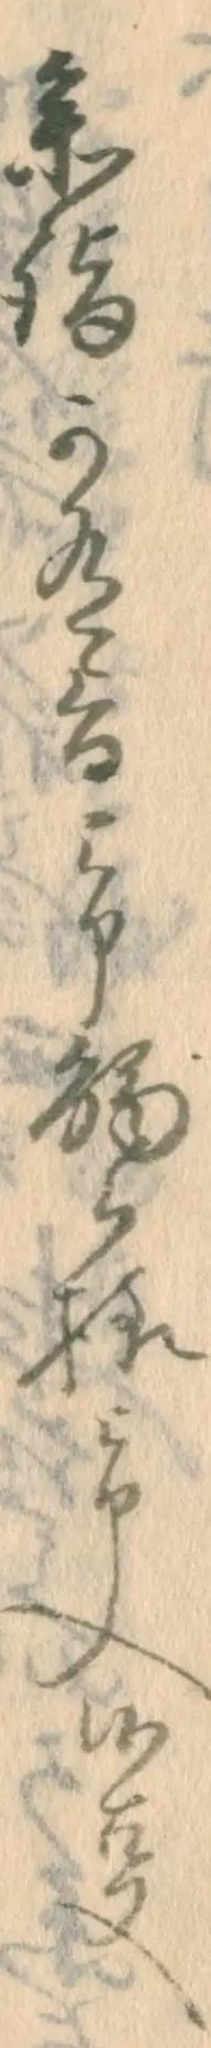参詣可有旨被申触候様被申入候事
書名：賀茂社記録. 第17冊
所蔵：国立国会図書館 National Diet Library, JAPAN
